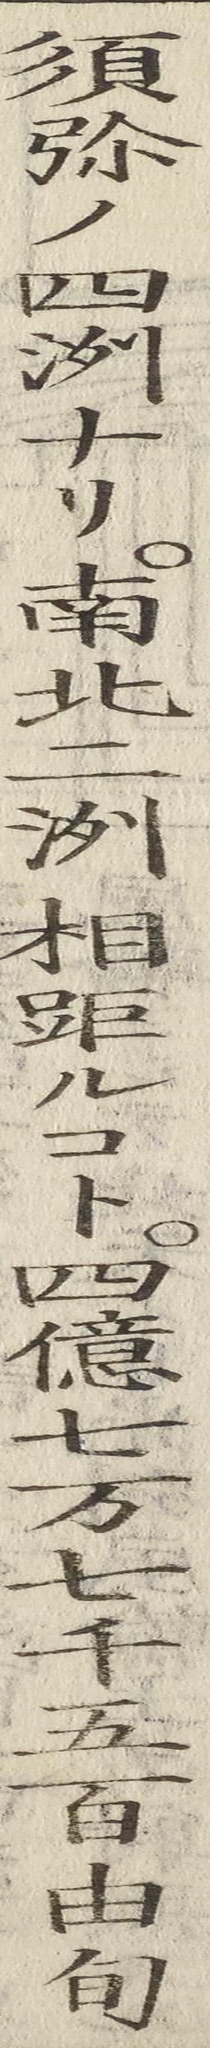須弥ノ四洲ナリ。南北ニ洲相距ルコト。四億七万七千五百由旬
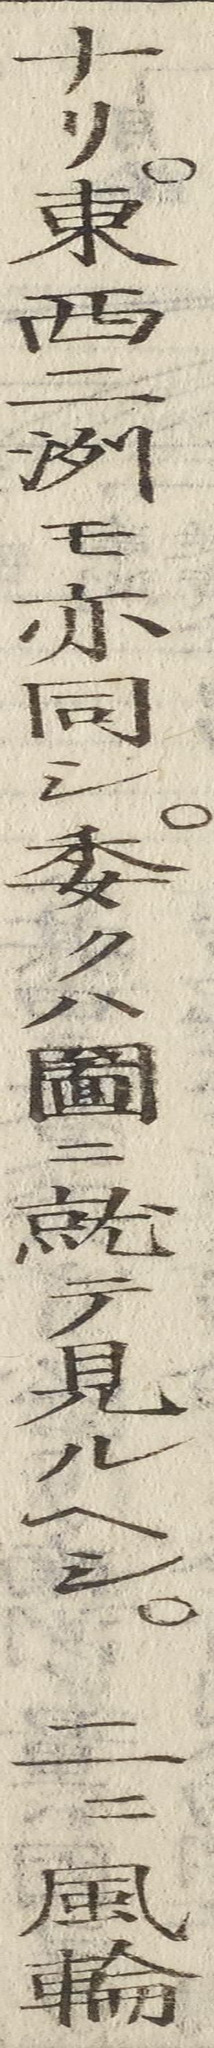ナリ。東西ニ洲モ亦同シ。委クハ図ニ就テ見ルヘシ。ニニ風輪
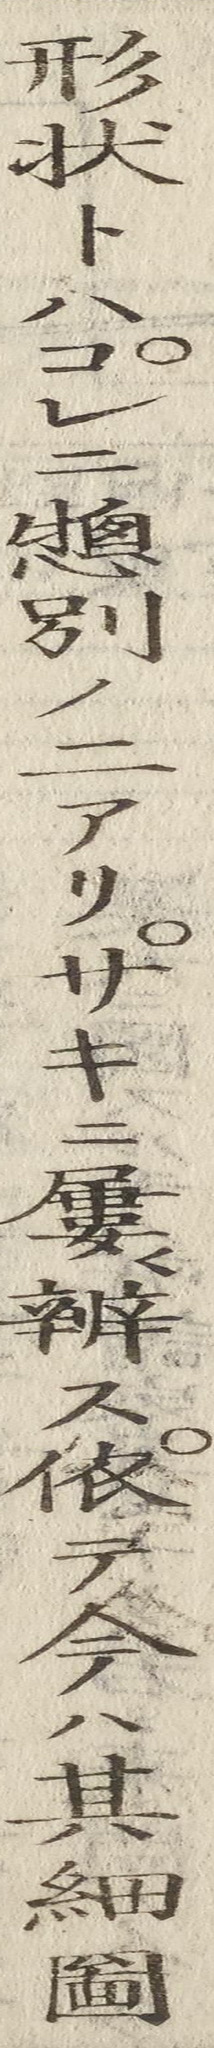形状トハ。コレニ惣別ノニアリ。サキニ屢〱弁ス。依テ今ハ其細図
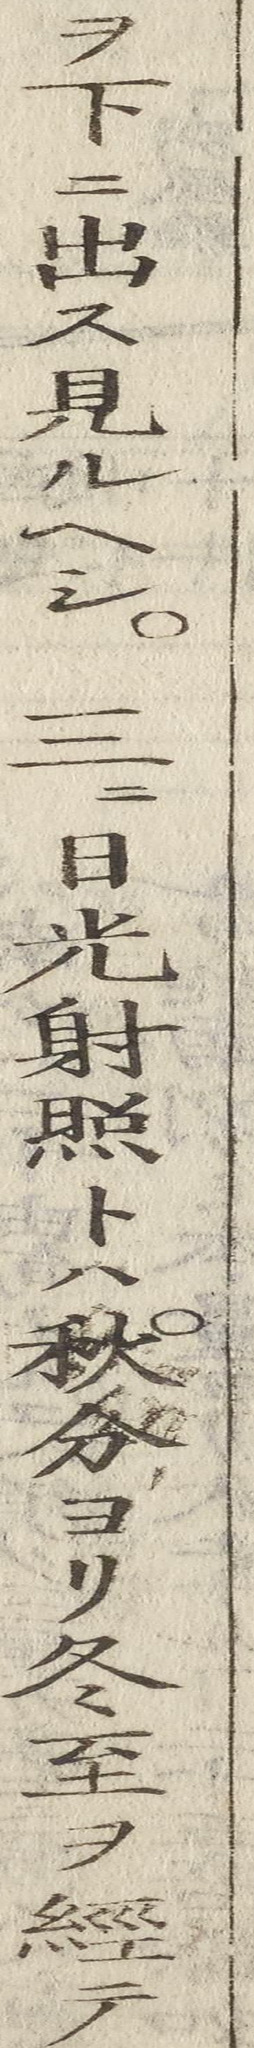ヲ下ニ出ス見ルヘシ。三ニ日光射照トハ。秋分ヨリ冬至ヲ経テ
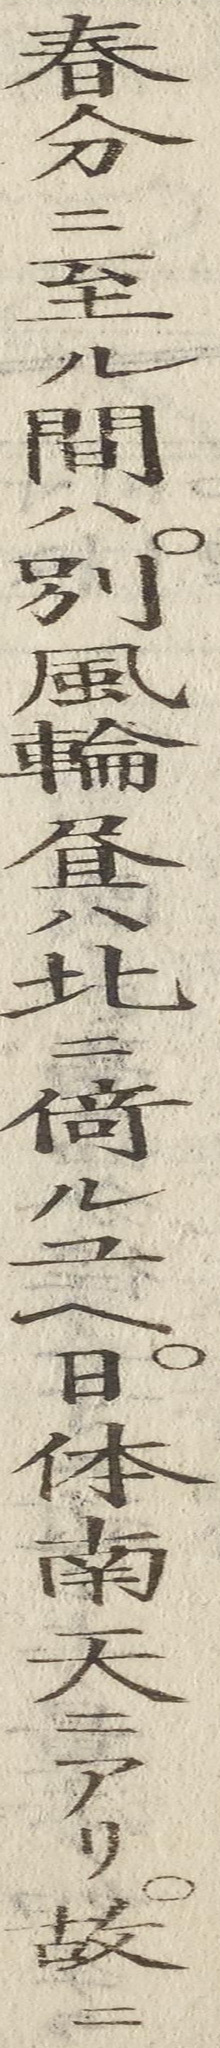春分ニ至ル間ハ。別風輪昼ハ北ニ倚ルユヘ。日体南天ニアリ。故ニ
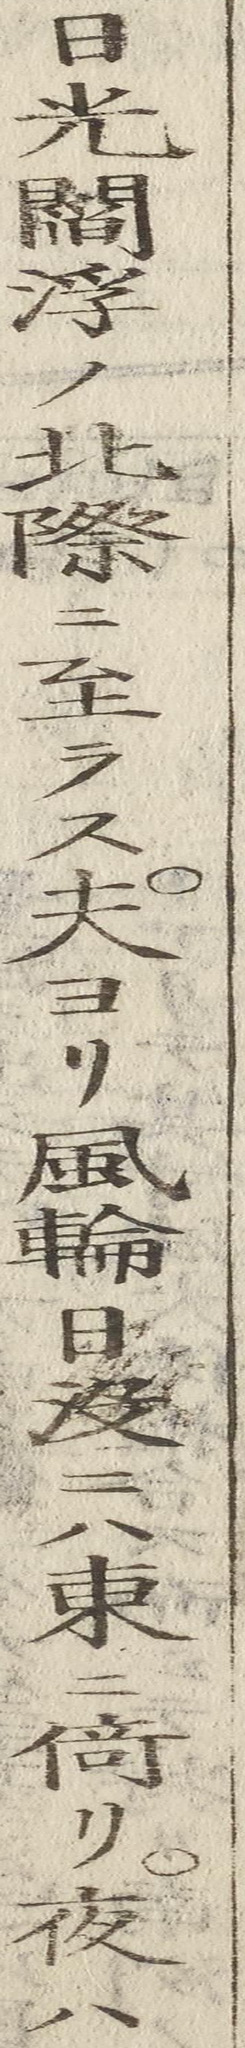日光閻浮ノ北際ニ至ラス。夫ヨリ風輪日没ニハ東ニ倚リ。夜ハ
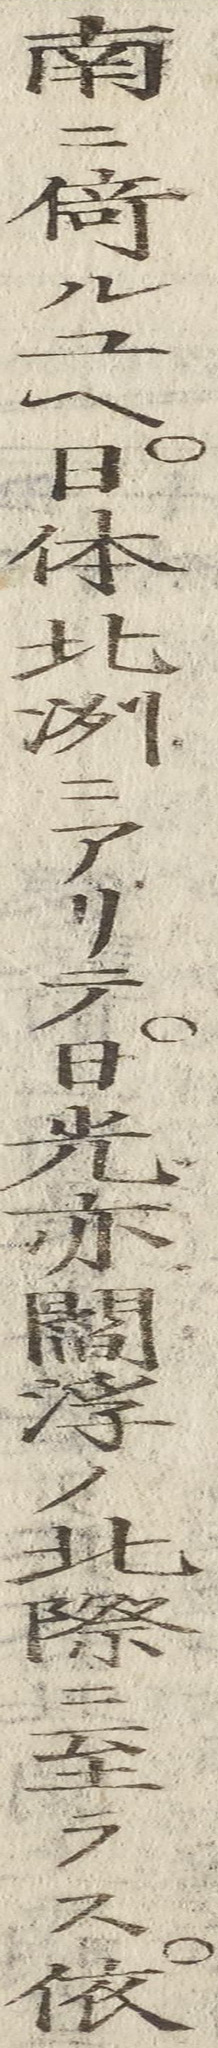南ニ倚ルユヘ。日体北洲ニアリテ。日光亦閻浮ノ北際ニ至ラス。依
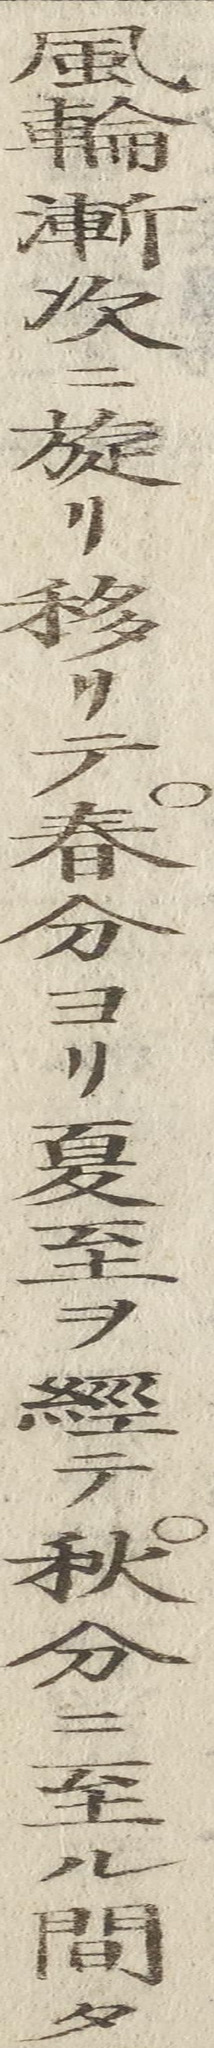風輪漸次ニ旋リ移リテ。春分ヨリ夏至ヲ経テ。秋分ニ至ル間タ
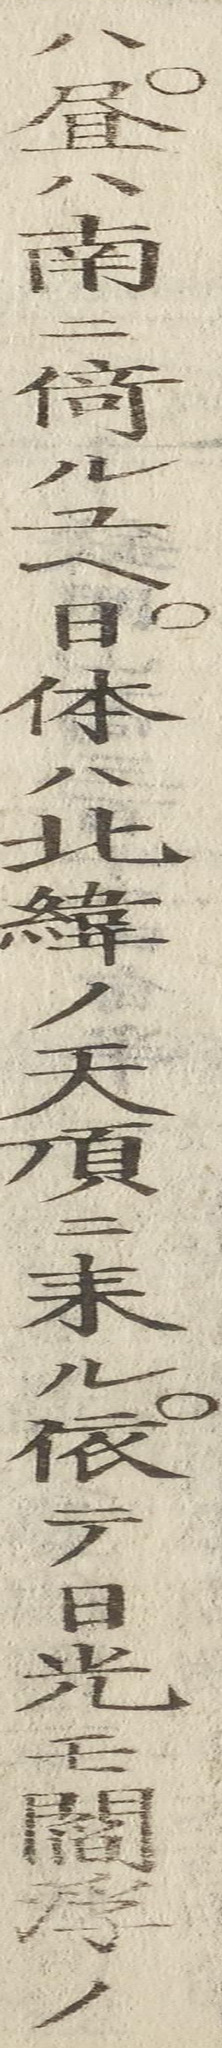ハ。昼ハ南ニ倚ルユヘ。日体ハ北緯ノ天頂ニ来ル。依テ日光モ閻浮ノ

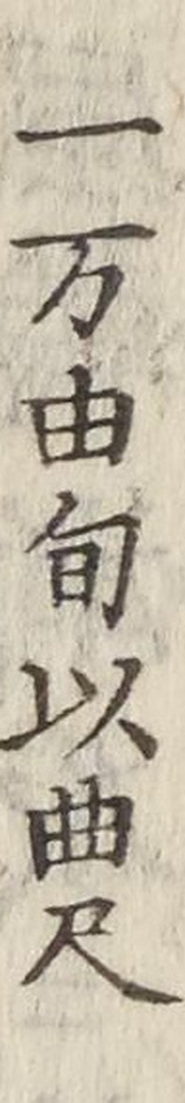一万由旬以曲尺
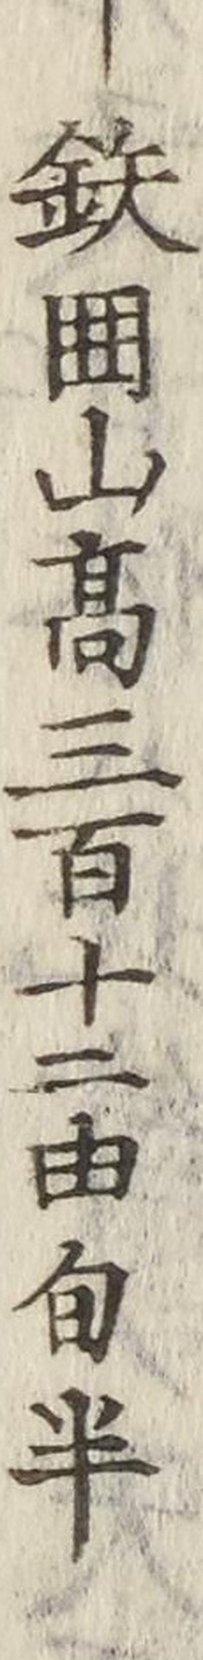鉄囲山高三百十二由旬半
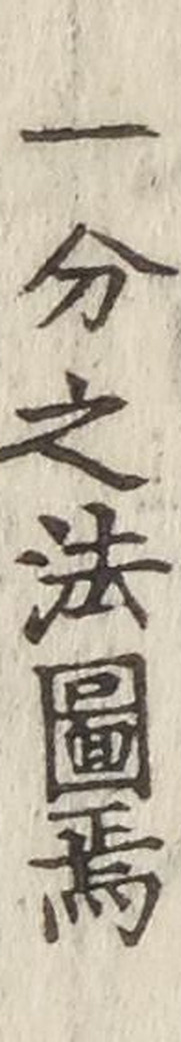一分之方形図焉
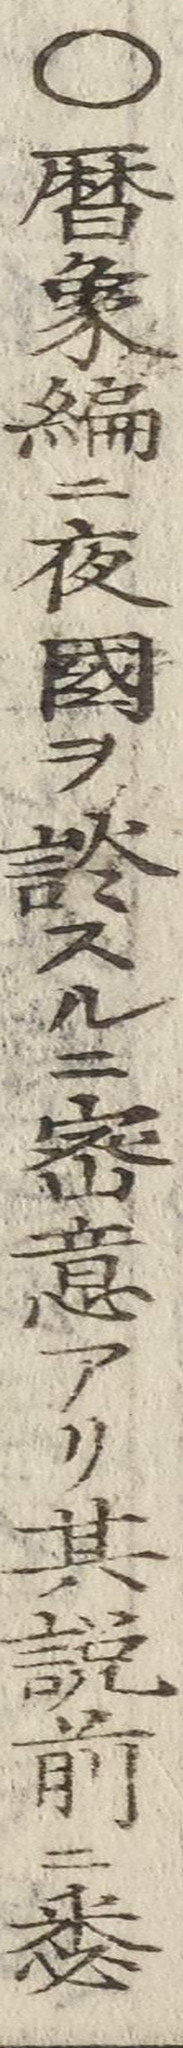〇暦象編ニ夜国ヲ談スルニ蜜意アリ其説前ニ悉
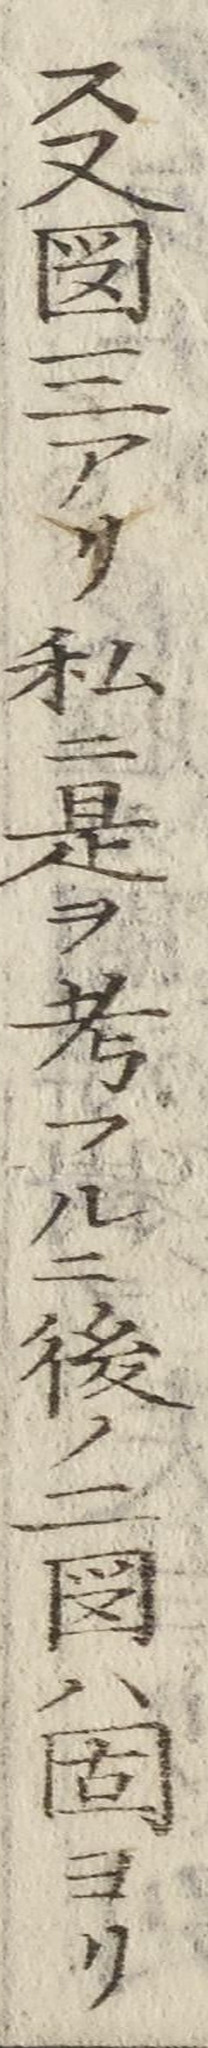ス又図三アリ私ニ是ヲ考フルニ後ノニ図ハ固ヨリ
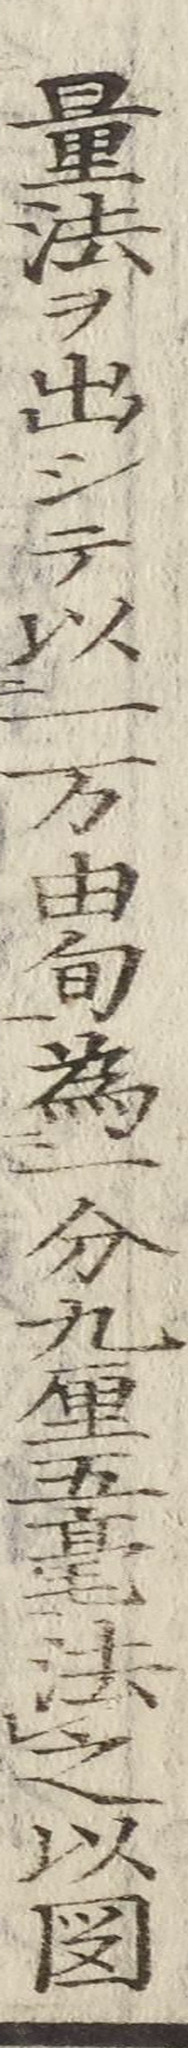量法ヲ出シテ以ニ一万由旬為ニ一分九厘五毛法之以図
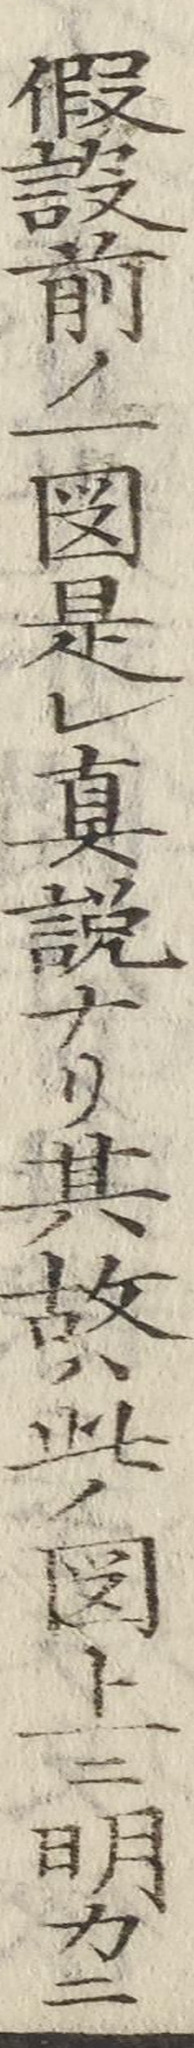仮設前ノ一図是レ真説ナリ其故ハ此ノ図上ニ明カニ
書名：護法新論　二編　上
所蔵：東京大学地震研究所図書室 Earthquake Research Institute Library, The University of Tokyo, JAPAN
